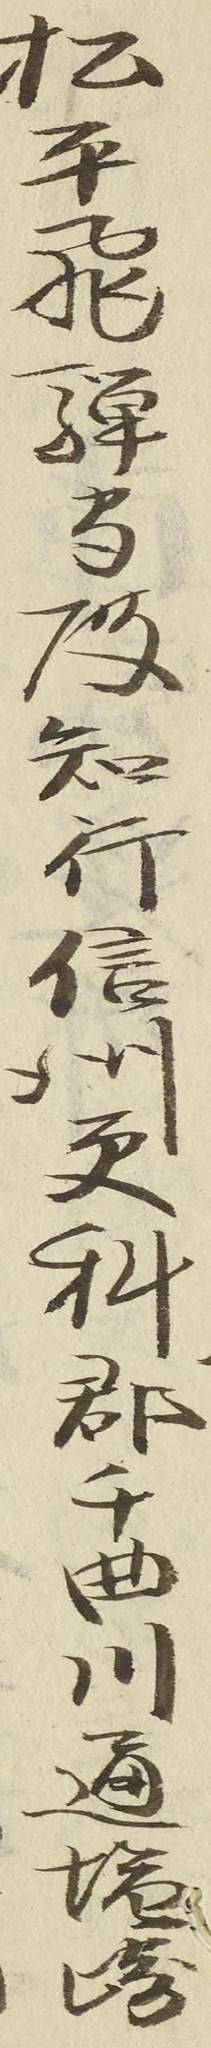松平飛騨守殿知行信州更級郡千曲川通塩崎
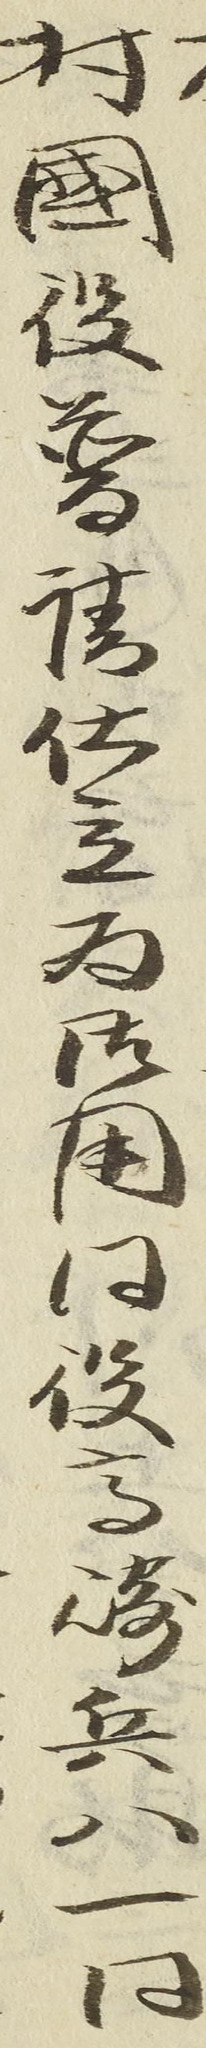村国役普請仕立為御用同役高崎平八一同
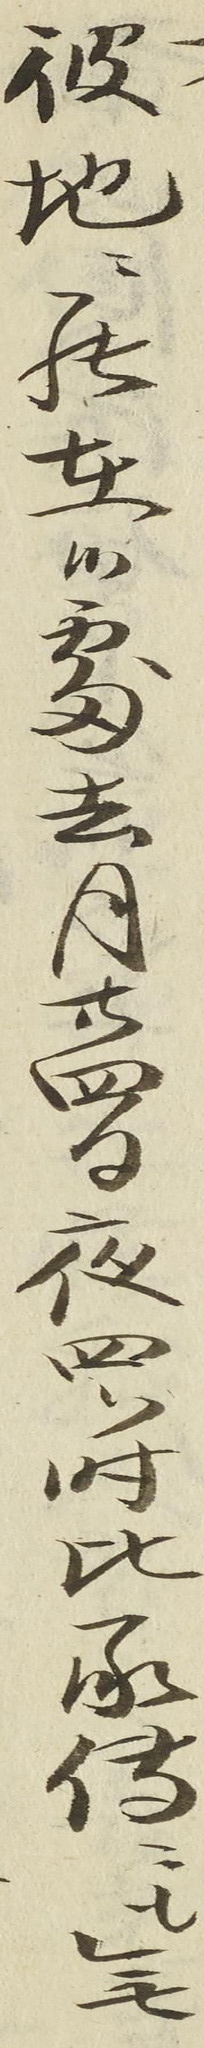彼地二罷在候所去月廿四日夜四ッ時比承伝二も無
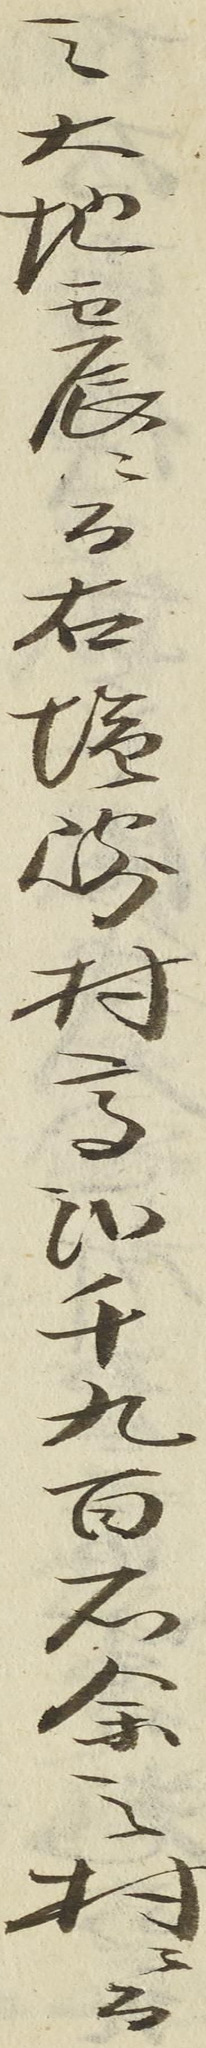之大地震二而右塩崎村高凡弐千九百石余之村々二而
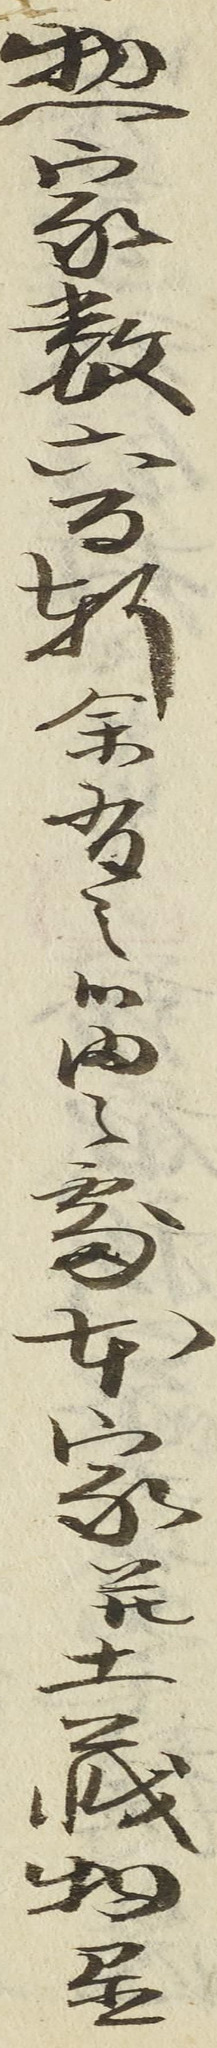惣家数六百軒余有之候由之処本家并土蔵物置
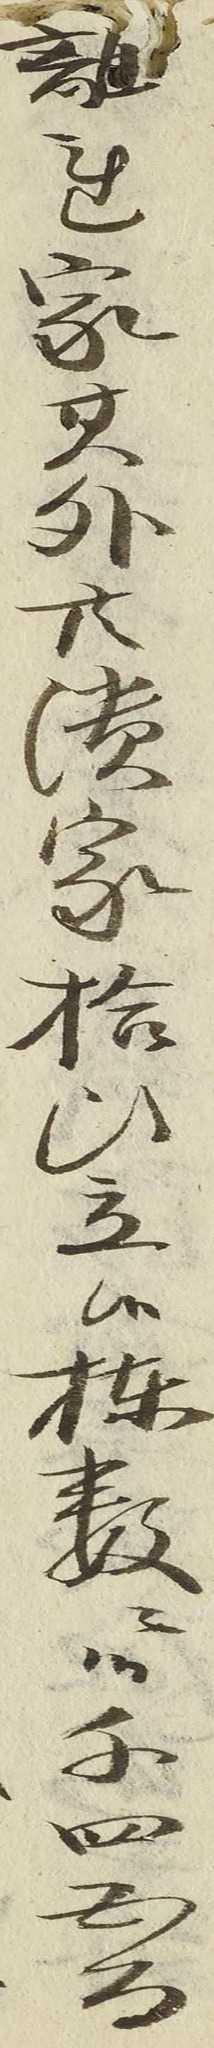離れ家其外共潰家拾ひ立候棟数二而千四五百
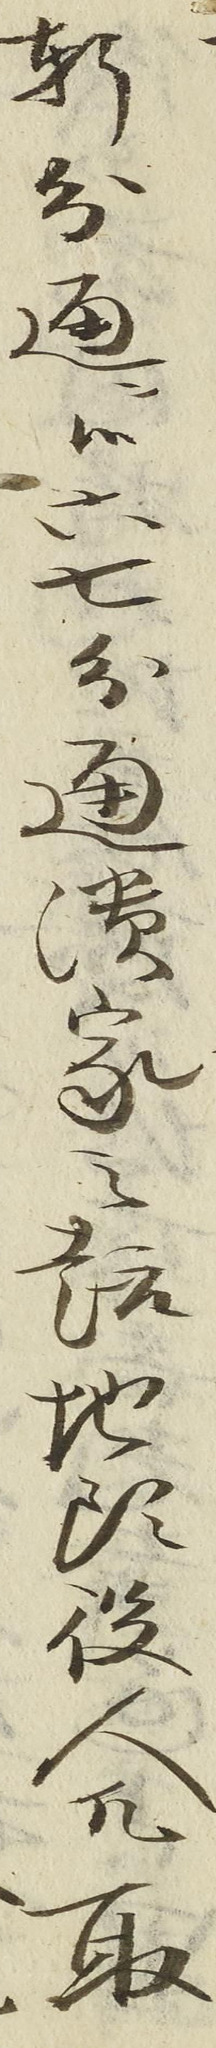軒分通二而六七分通潰家之趣地頭役人凡取
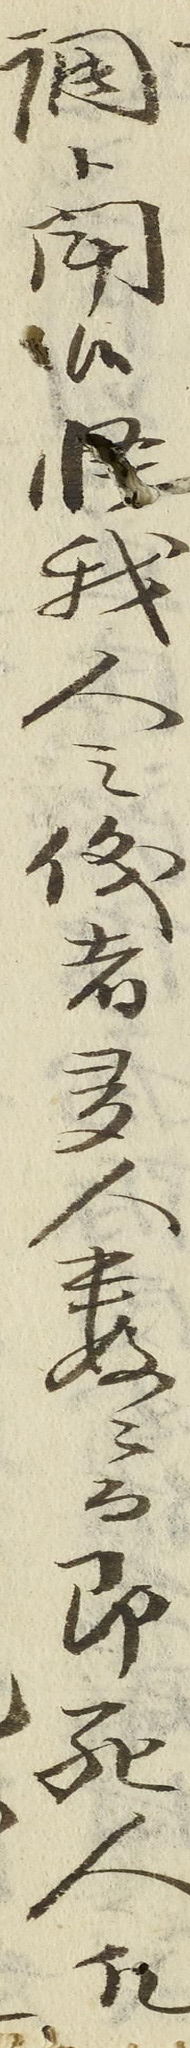調申聞候怪我人之儀は多人数二而即死人凡
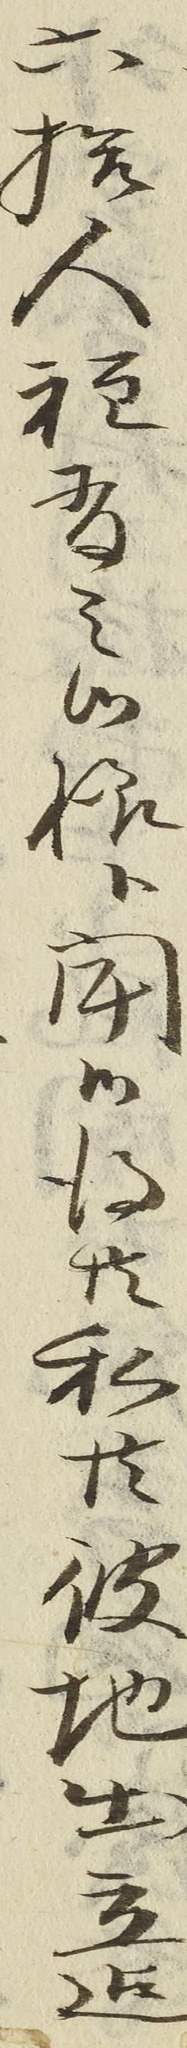六拾人程有之候様申聞候得共私共彼地出立迄
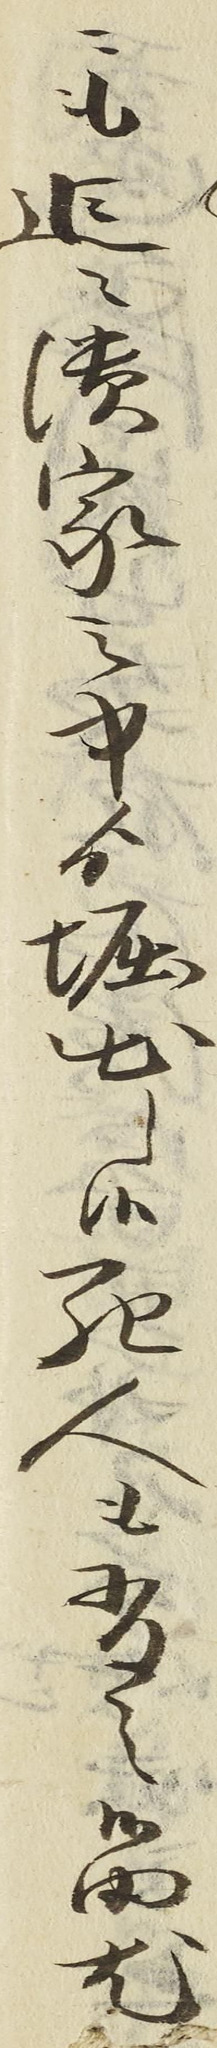二も追々潰家之中ゟ掘出し候死人も有之候由尤
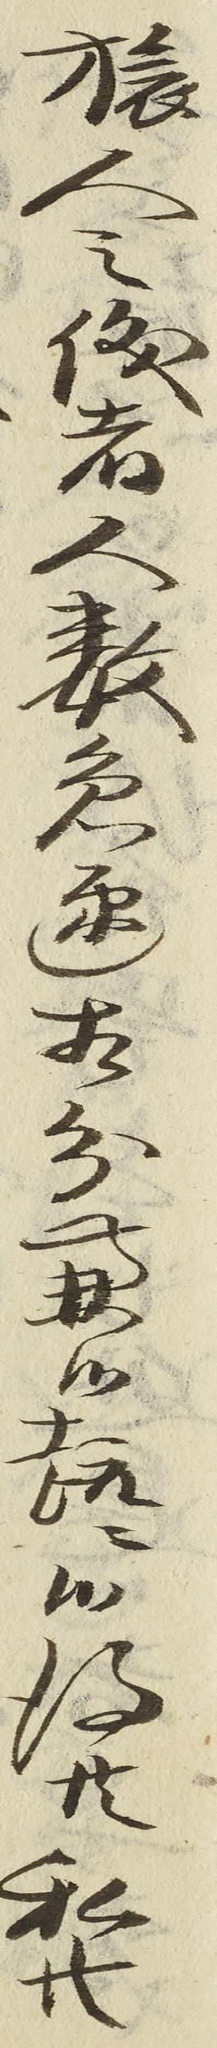旅人之儀は人数急速相分兼候趣二御座候得共私共
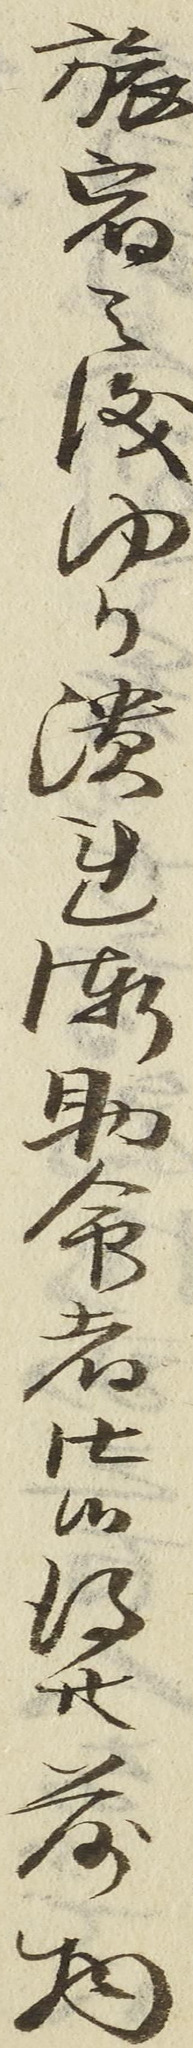旅宿之儀ゆり潰れ漸助命は仕候得共荷物
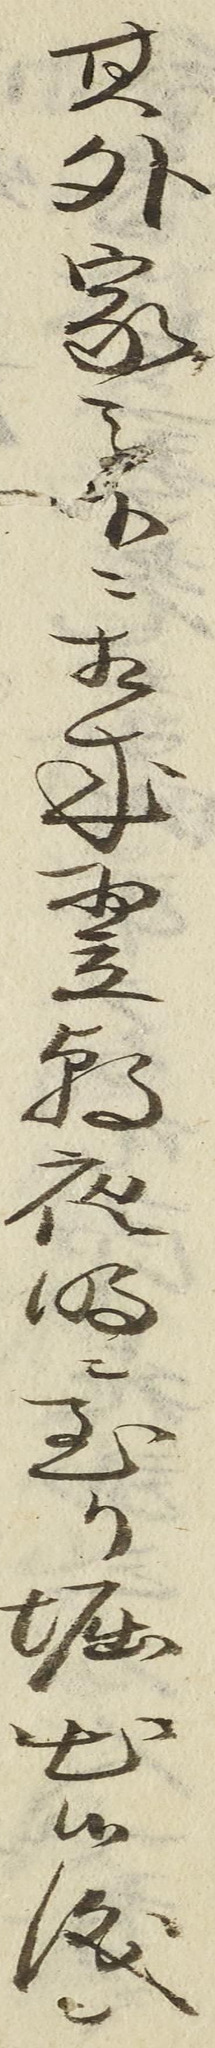其外家之下二相成翌朝夜明二至り掘出候儀二
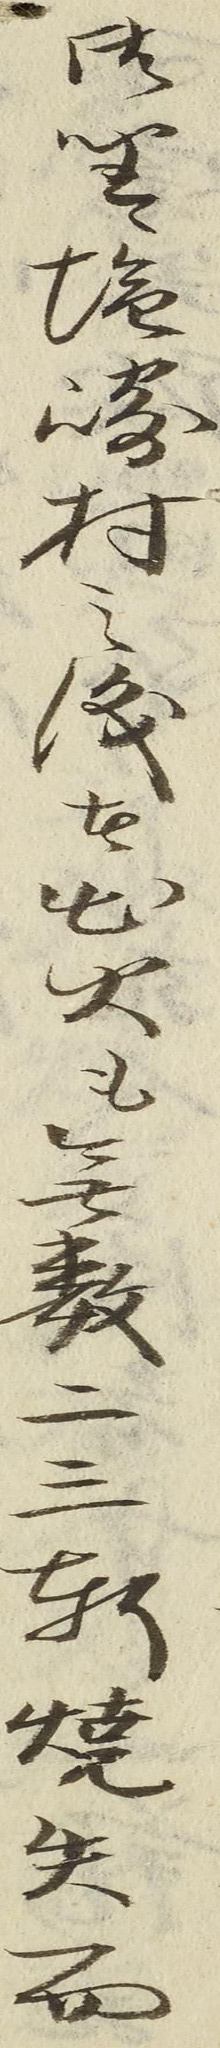御坐候塩崎村之儀ハ出火も無数二三軒焼失而
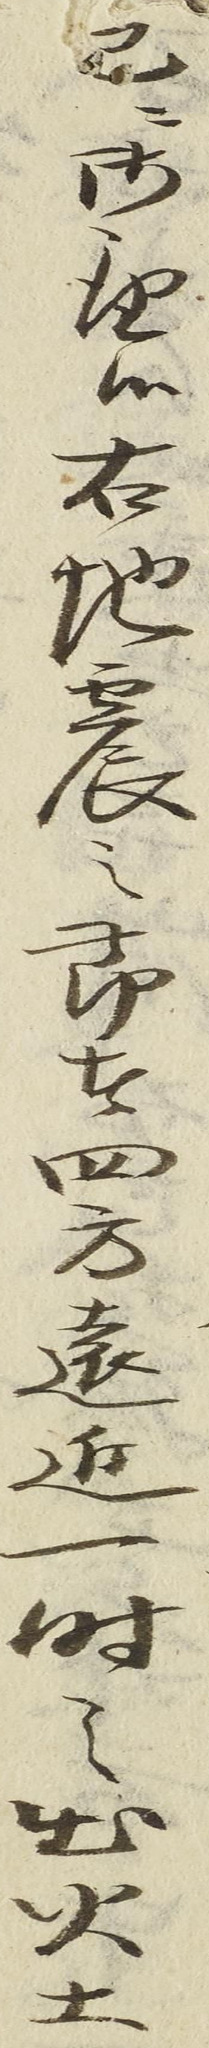已二御座候右地震之節は四方遠近一時之出火土
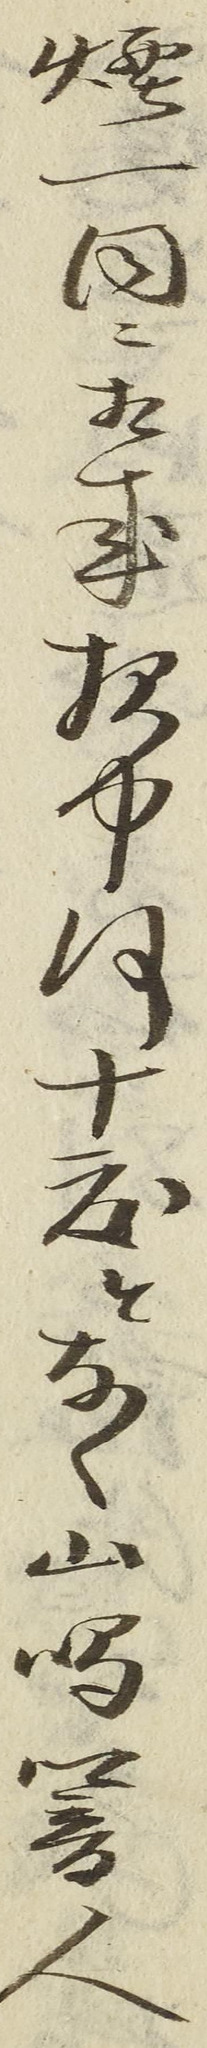煙一同二相成夜中何十度となく山鳴響人
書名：信濃國大地震記　乾
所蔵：東京大学地震研究所図書室 Earthquake Research Institute Library, The University of Tokyo, JAPAN
